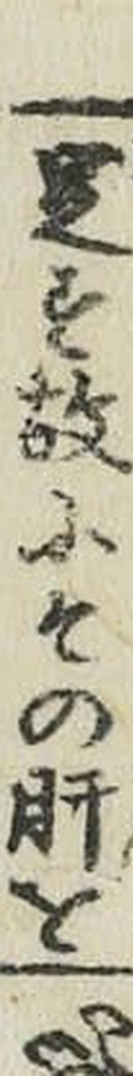足す故にその肝を
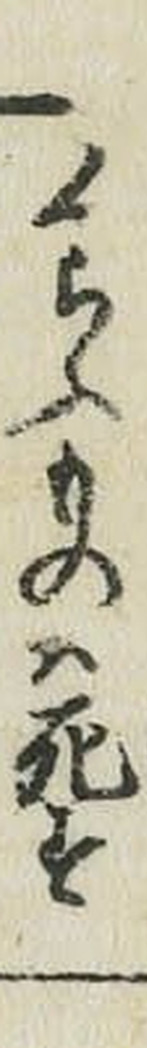くらふものは死す
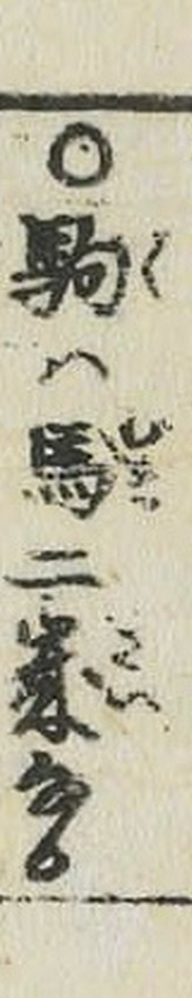○駒は馬二歳なる
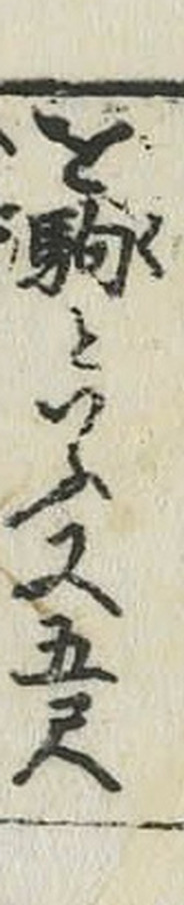を駒といふ又五尺
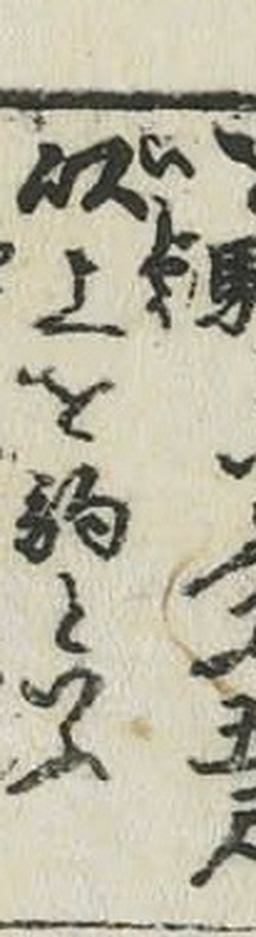以上を駒といふ
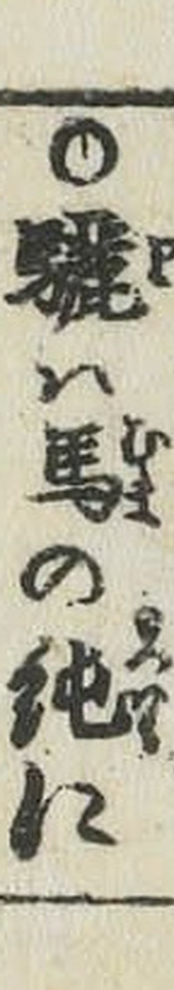○驪は馬の純に
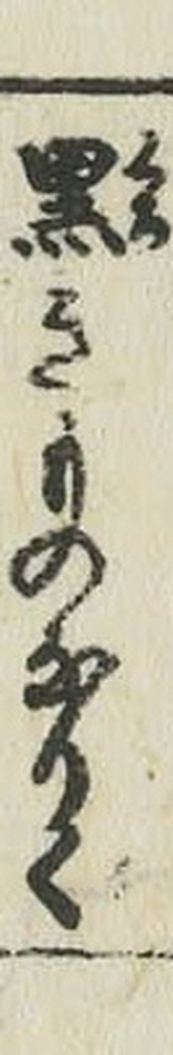黒きものなりく
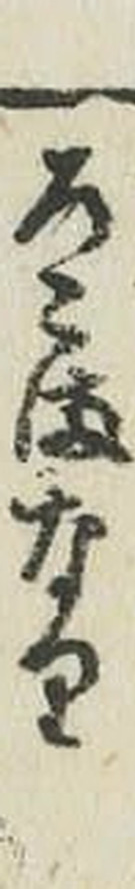ろこまなり
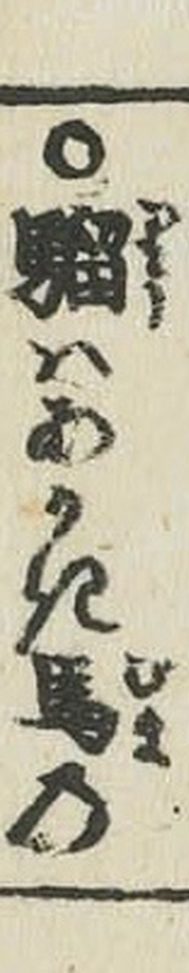○騮はあかき馬の
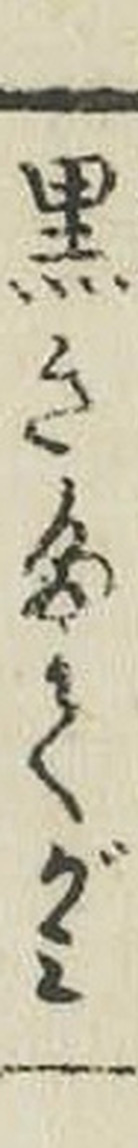黒きたてがみ
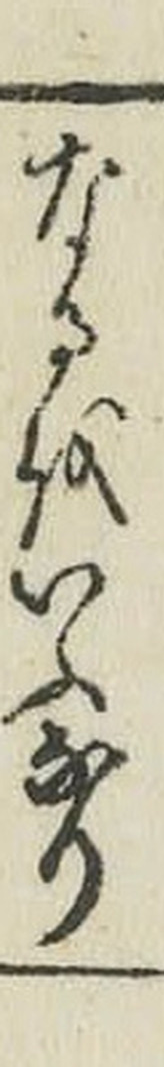なるをいふなり
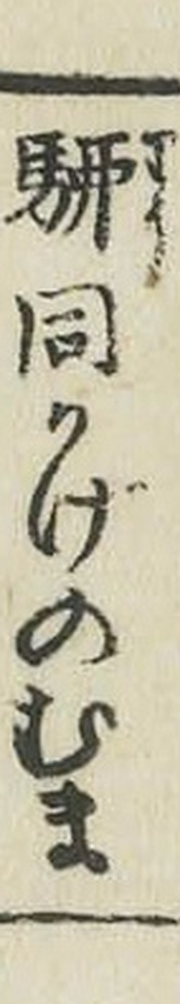駵同かげのむま
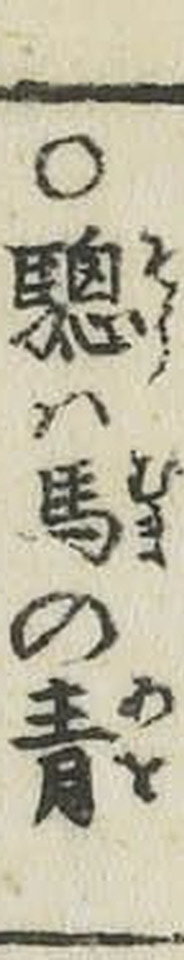○驄は馬の青
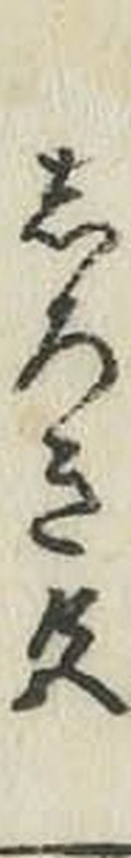しろき色
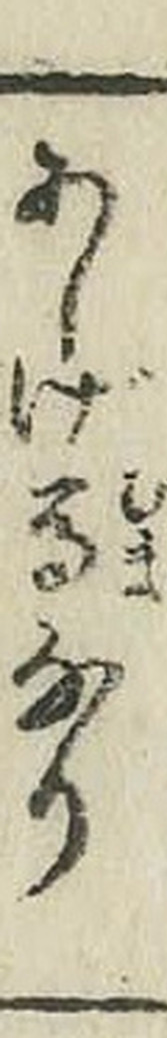あしげ馬なり
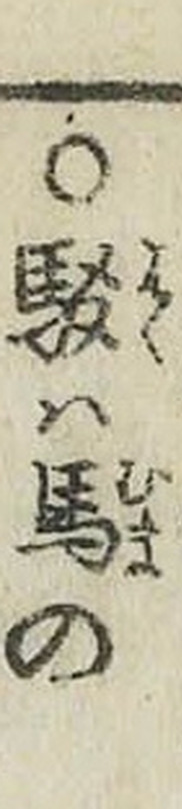○駁は馬の
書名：増補頭書訓蒙図彙大成 10巻 6:巻之12-13
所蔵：東京学芸大学教育コンテンツアーカイブ
